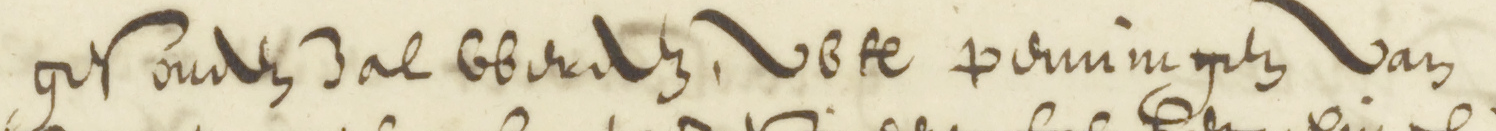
gesonden sal werden, wte penningen van
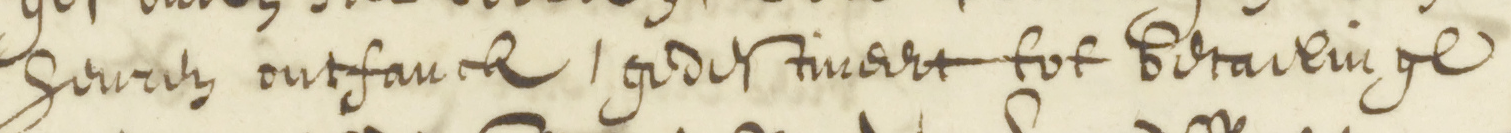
heuren ontfanck, gedestineert tot betaelinge
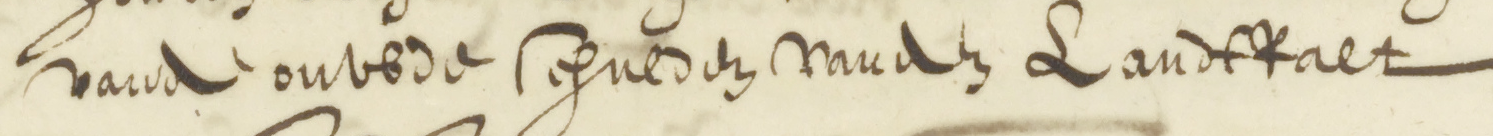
vande ouwde schulden vanden LandtRaet
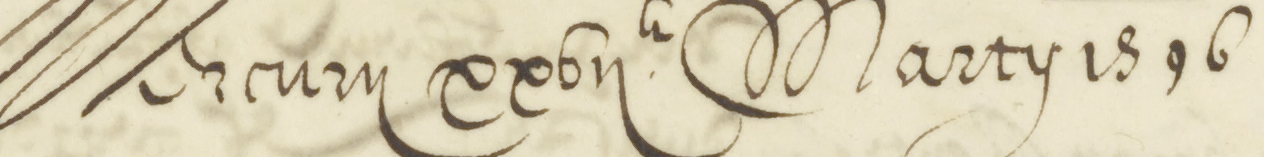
Mercury XXVIIen Marty 1596
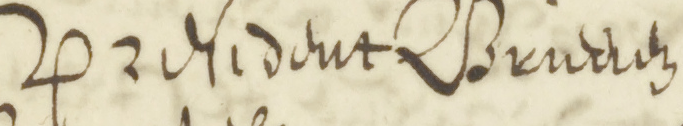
President Brienen
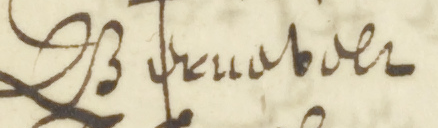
Bernevelt
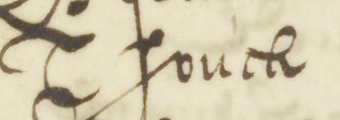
TJonck
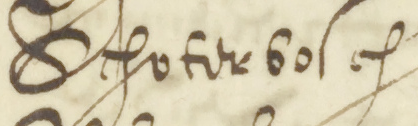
Schoterbosch
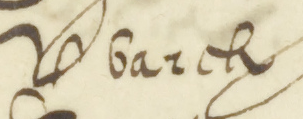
Warck
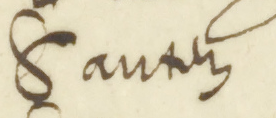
Santen
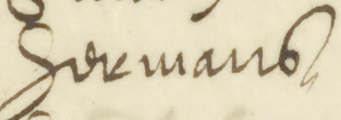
Hermans
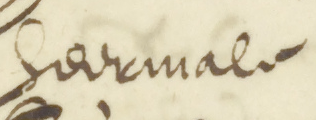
Heermale
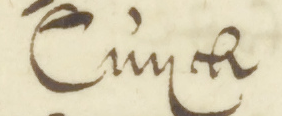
Cuyck
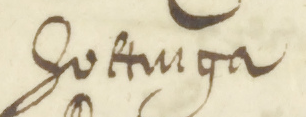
Hottinga
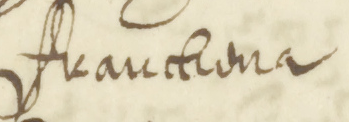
Franckena
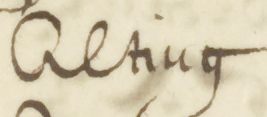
Alting
